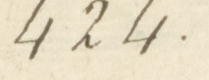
424.
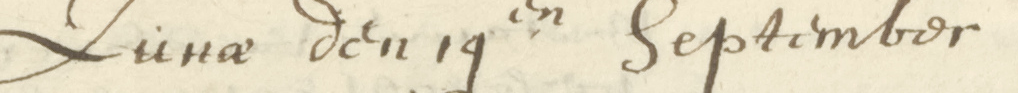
Lunae den 14en September
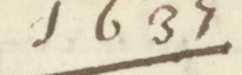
1637
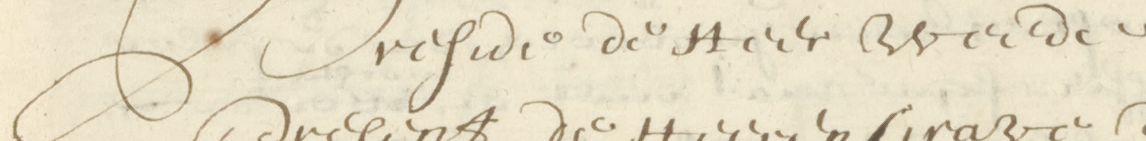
Preside de Heer Weede
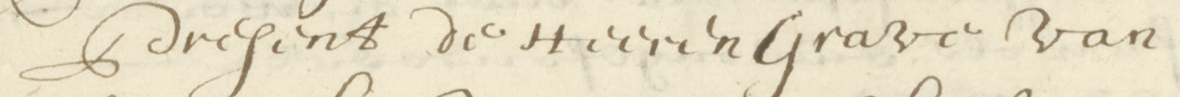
Present de Heeren Grave van
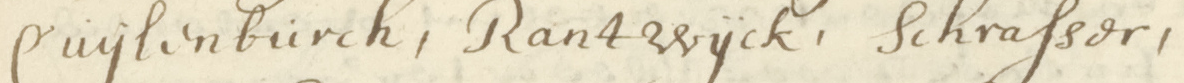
Cuijlenburch, Rantwijck, Schrasser,
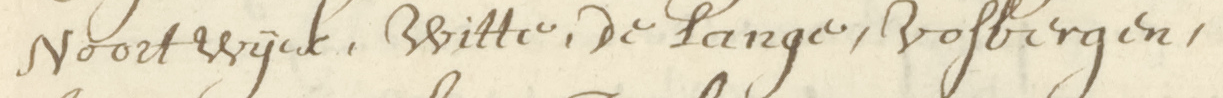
Noortwijck, Witte, de Lange, Vosbergen,
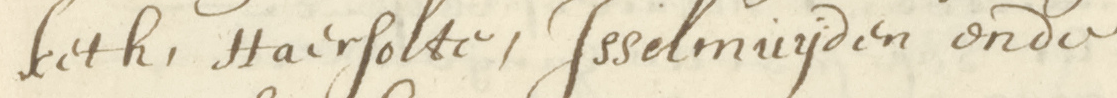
Keth, Haerholte, Isselmuijden ende
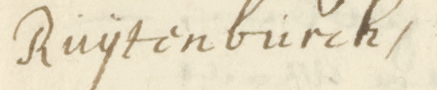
Ruijtenburch.
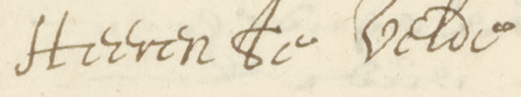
Heeren te velde
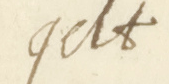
gelt
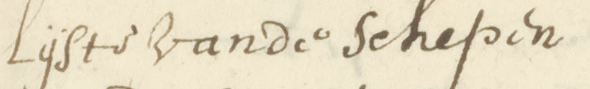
Lijste vande schepen
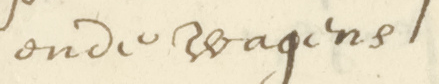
ende wagens
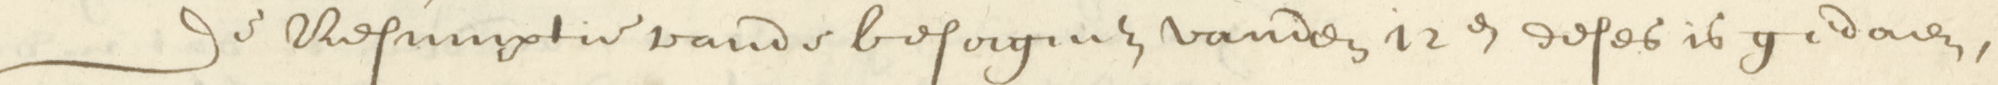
De resumptie vande besoignen vanden 12e deses is gedaen.
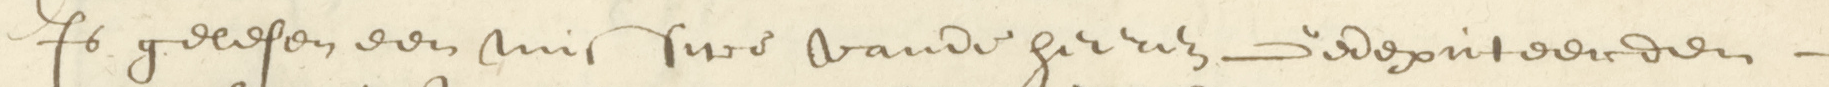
Is gelesen een missive vande heeren Gedeputeerden -
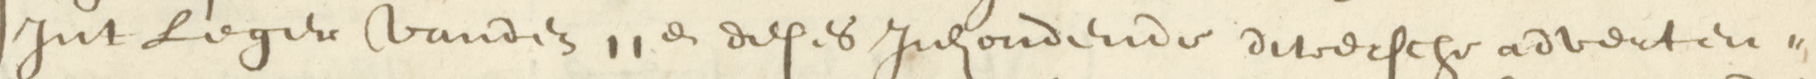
int Leger vanden 11e deses Inhoudende diversche adverten„
